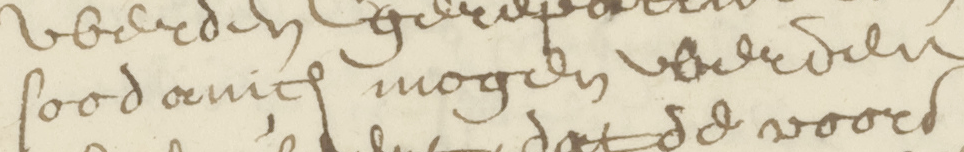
soodanich mogen werden
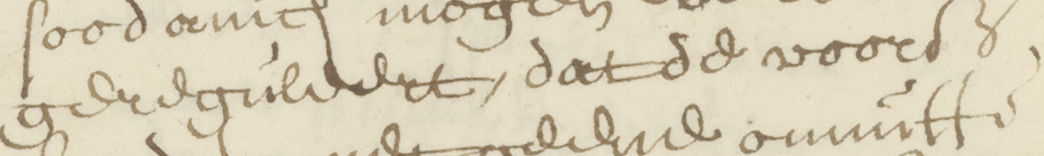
gereguleert, dat de voors
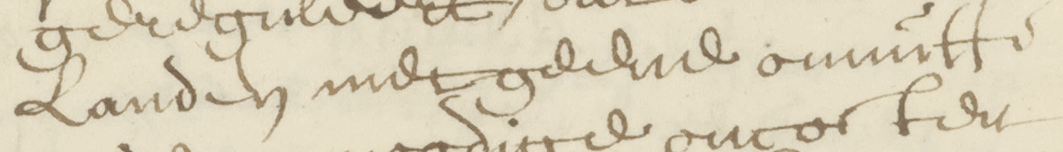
Landen met geene onnutte
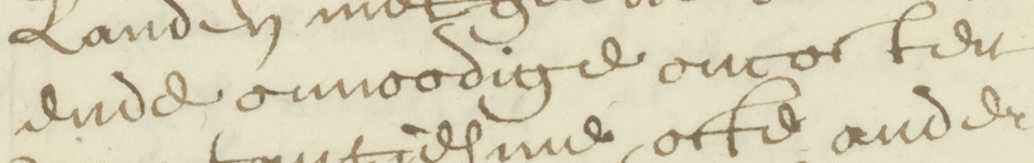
ende onnoodige oncosten
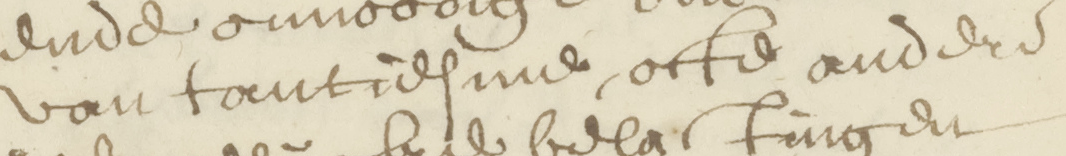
van tantiesime, ofte andere
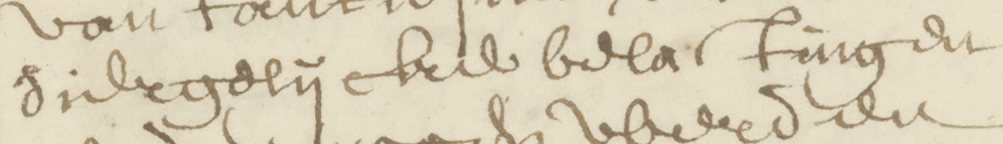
diergelijcke belastingen
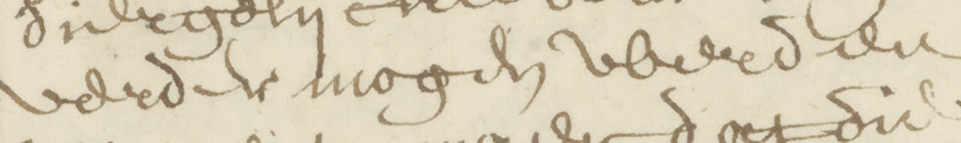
verder mogen werden
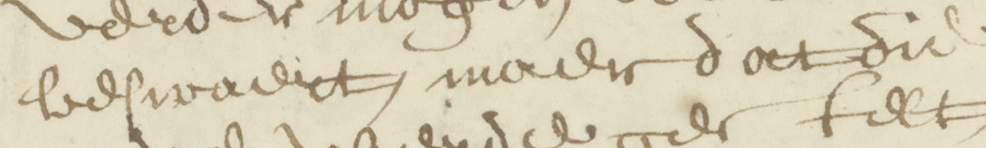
beswaert, maer dat die
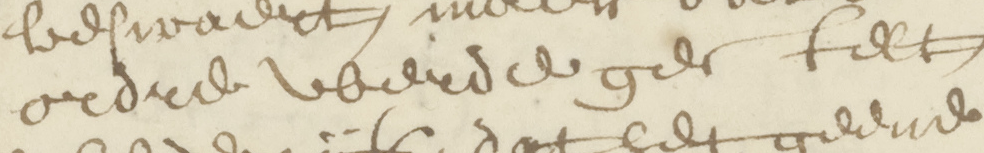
ordre werde gestelt
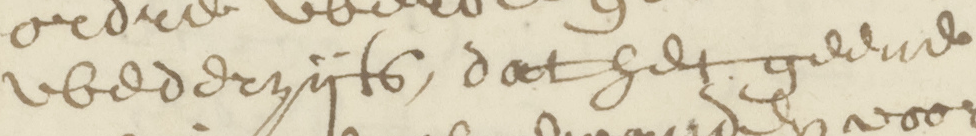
wederzijts, dat het geene
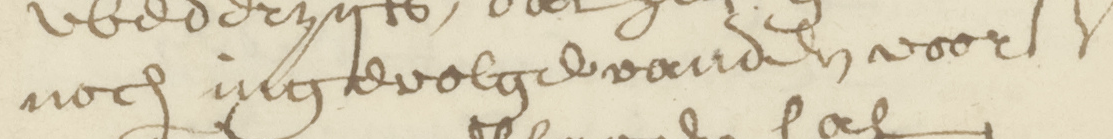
noch ingevolge vanden voors
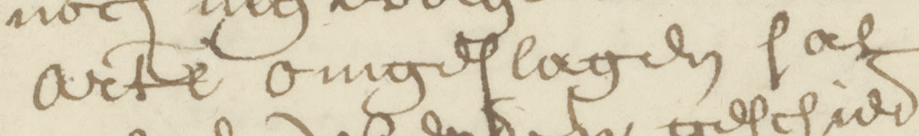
artl omgeslagen sal
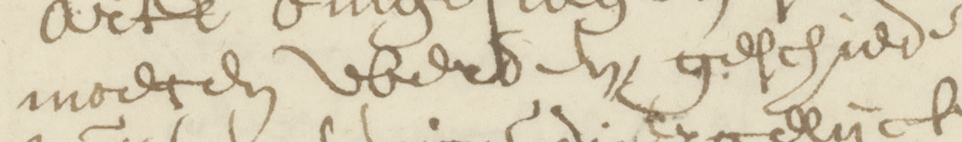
moeten werden, geschiede
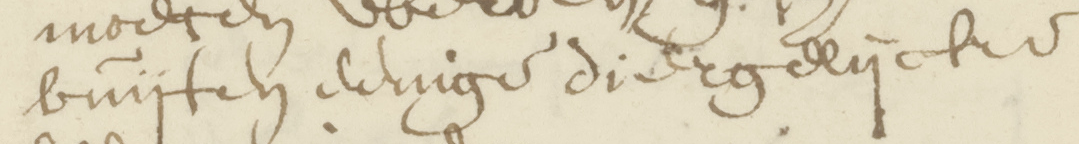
buijten eenige diergelijcke
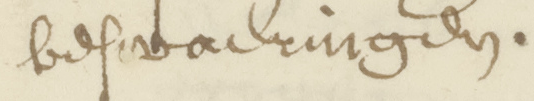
beswaeringen.
